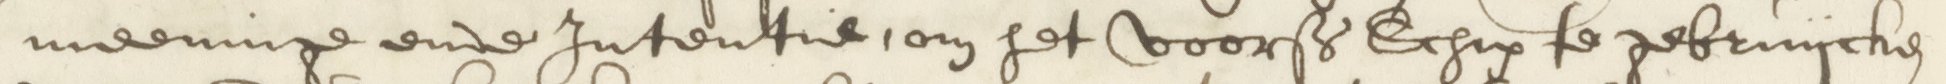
meeninge ende Intentie, om het voors Schip te gebruijcken
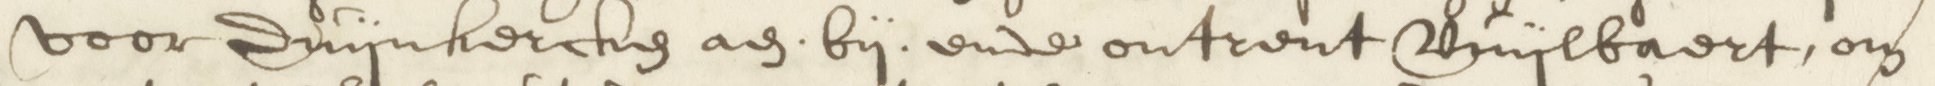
voor Duijnkercken aen. bij. ende ontrent Vuijlbaert, om
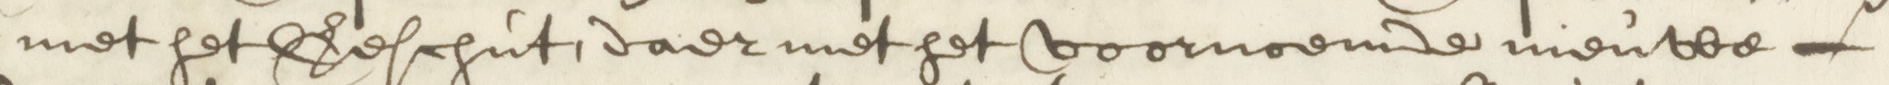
met het Geschut, daer met het voornoemde nieuwe —
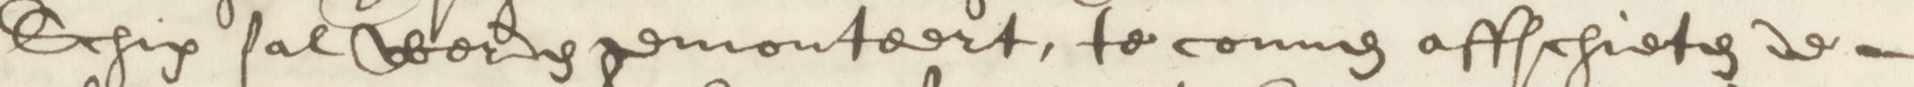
Schip sal werden gemonteert, te connen affschieten de —
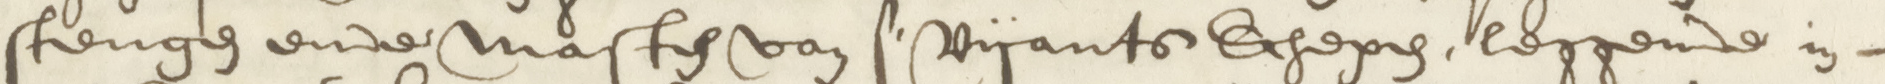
stengen ende masten van s‛Vijants Schepen, leggende in —
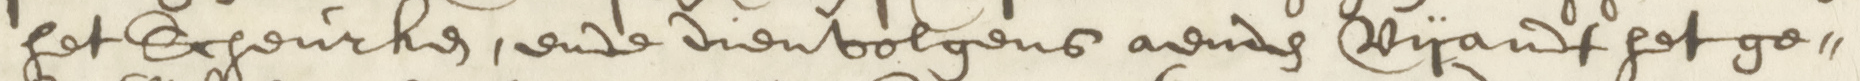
het Scheurken, ende dienvolgens aenden Vijandt het ge„
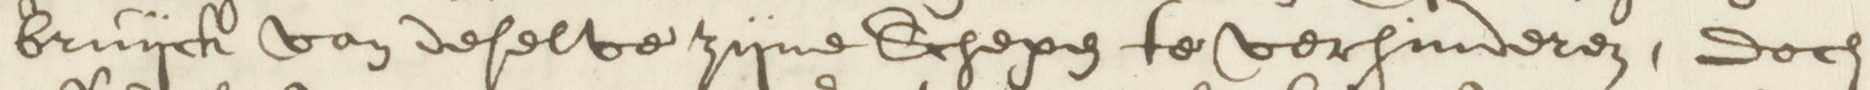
bruijck van deselve zijne Schepen te verhinderen, doch —
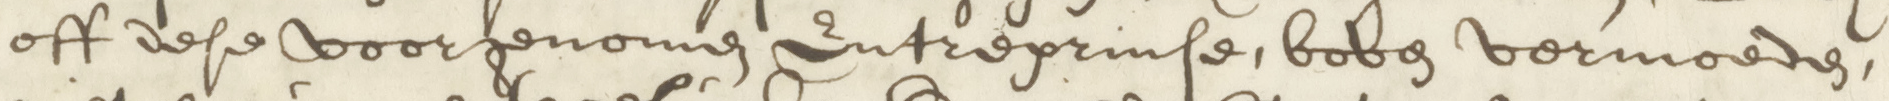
off dese voorgenomen Entreprinse, boven vermoeden,
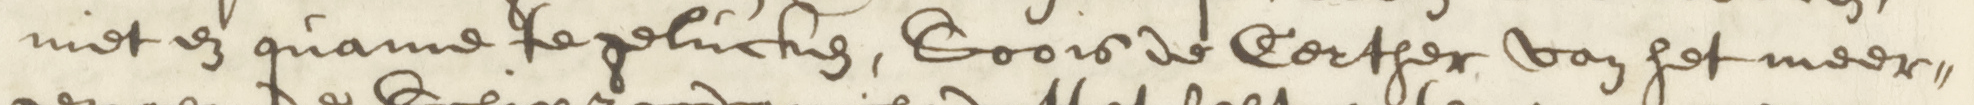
niet en quame te gelucken, Soo is de Certher van het meer„
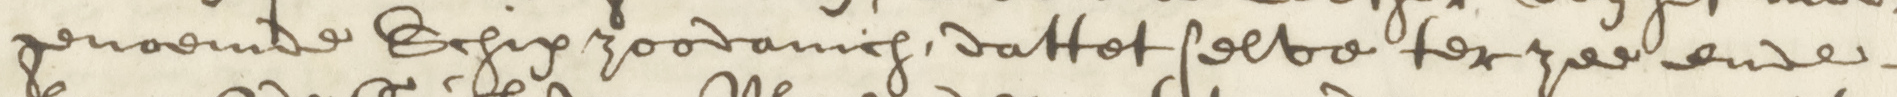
genoemde Schip zoodanich, dattet selve ter zee ende —
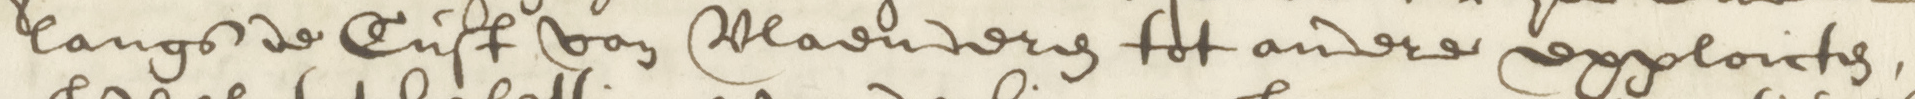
langs de Cust van Vlaenderen tot andere exploicten,
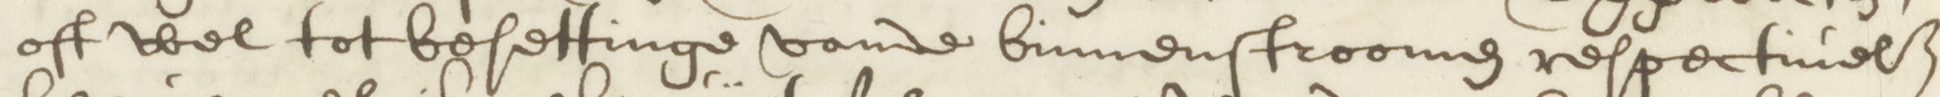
off wel tot besettinge vande binnenstroomen respectiuel
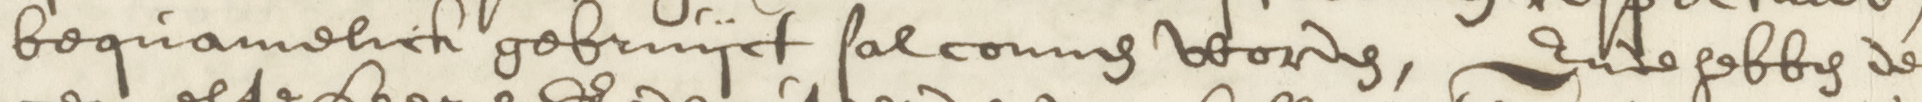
bequamelick gebruijct sal connen worden. Ende hebben de
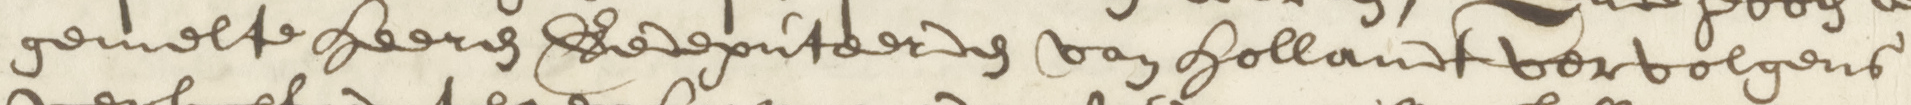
gemelte Heeren Gedeputeerden van Hollandt vervolgens
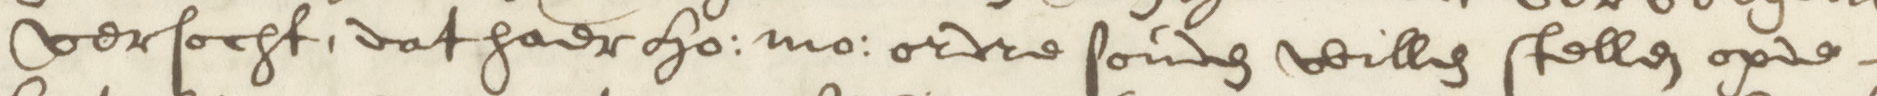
versocht, dat haer Ho:Mo: ordre souden willen stellen opde -
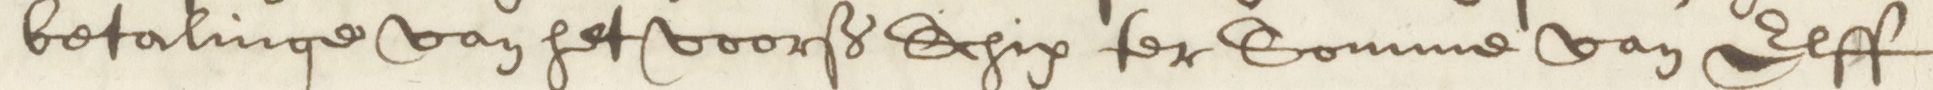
betalinge van het voors Schip ter Somme van Elff
